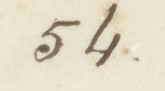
54.
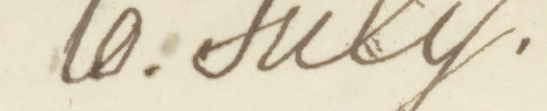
10. July.
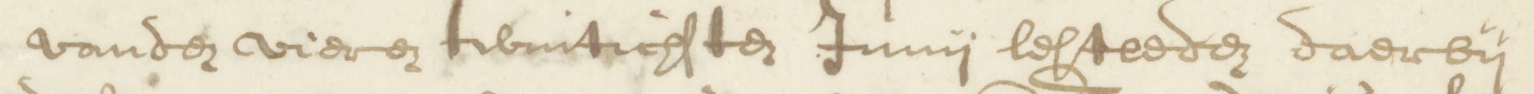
vanden vieren twintichsten Junij lestleden daerbij
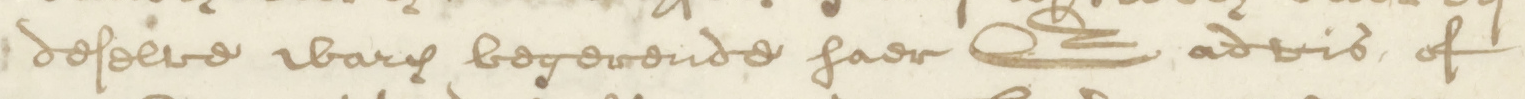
deselve waren begerende haer E. advis of
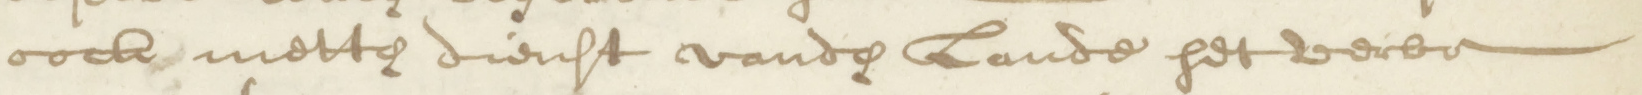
oock metten dienst vanden Lande het verbot
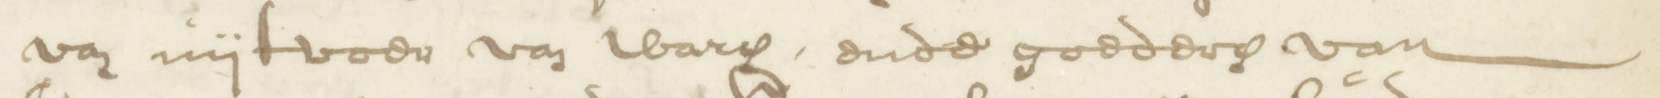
van uijtvoer van waren, ende goederen van
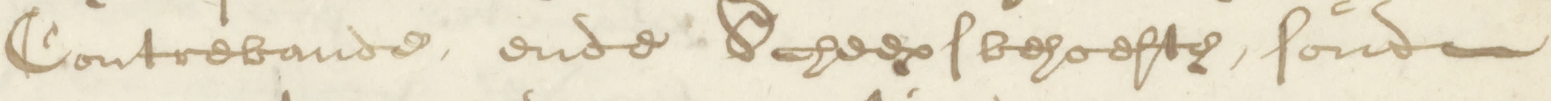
Contrebande, ende Scheepsbehoeften, soude
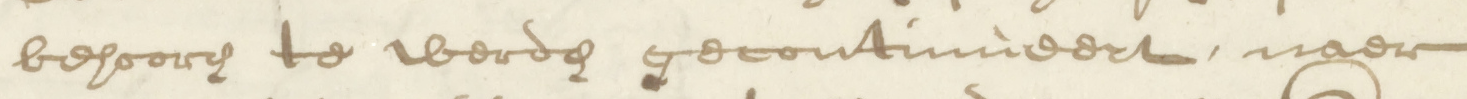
behooren te werden gecontinueert, naer
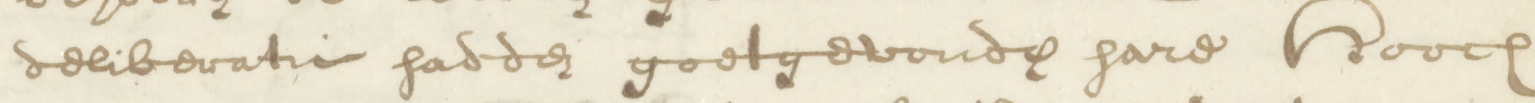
deliberatie hadden goetgevonden hare Hooch
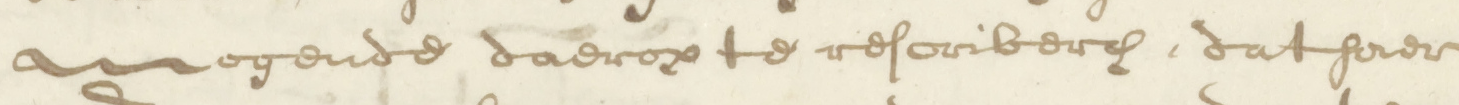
Mogende daerop te rescriberen, dat haer
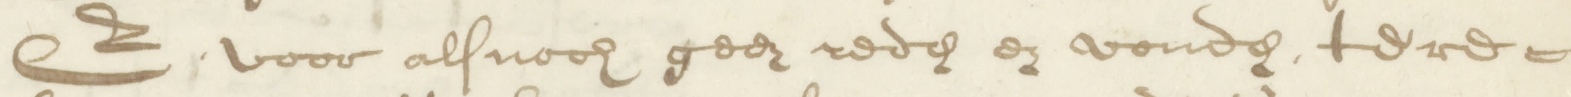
E. voor alsnoch geen reden en vonden, te re=
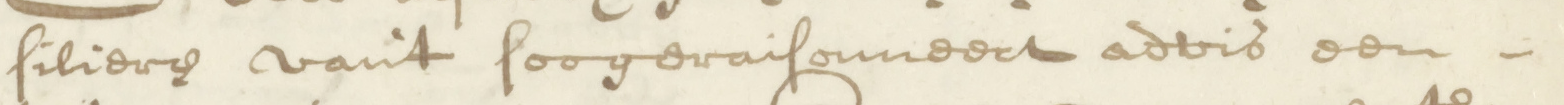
silieren van‛t soo geraisonneert advis een —
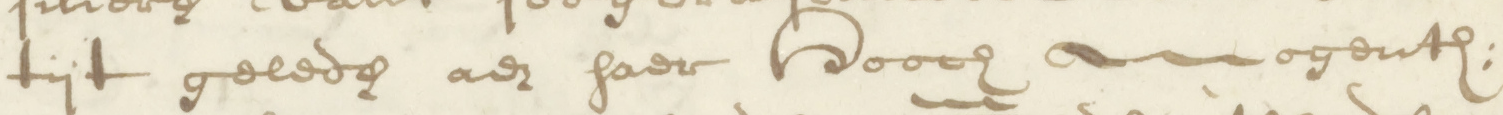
tijt geleden aen haer Hooch Mogenth:
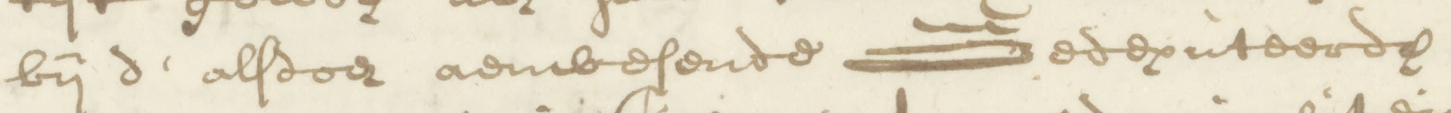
bij d‛ alsdoen aenwesende Gedeputeerden
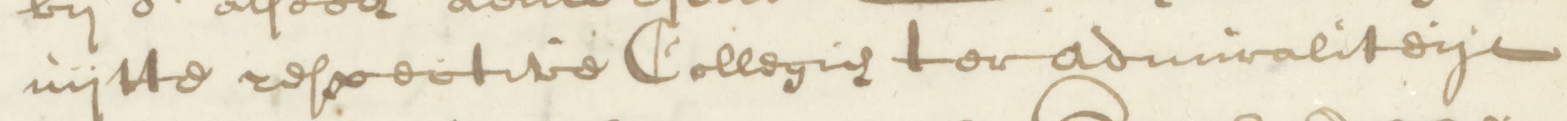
uijtte respective Collegien ter Admiraliteijt
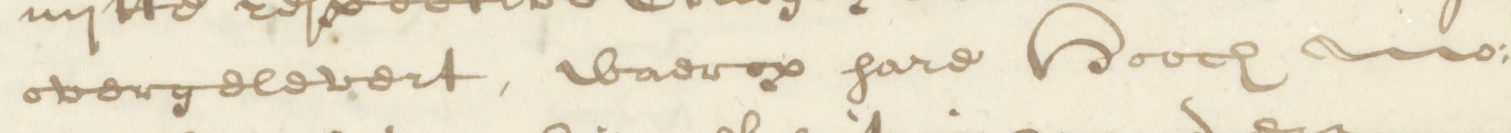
overgelevert, waerop hare Hooch Mo:
